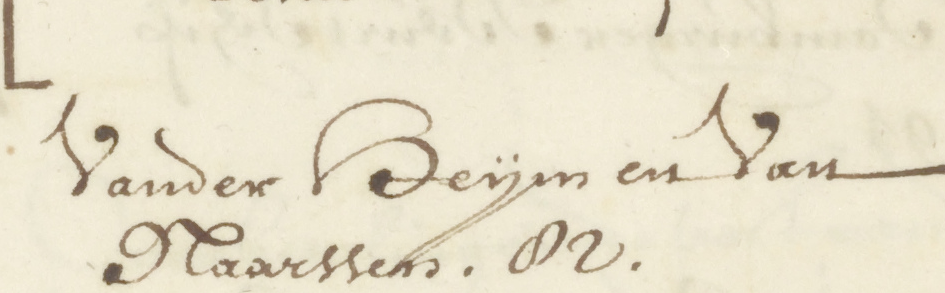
Vander Heijm en Van
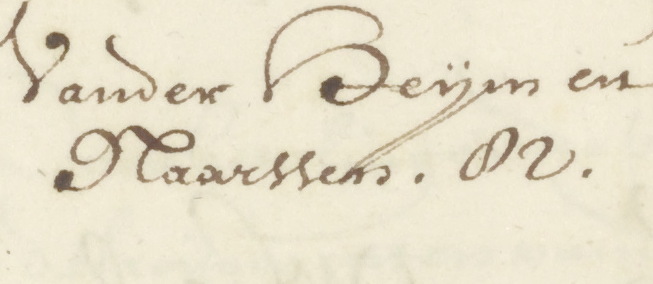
Maarssen, 82.
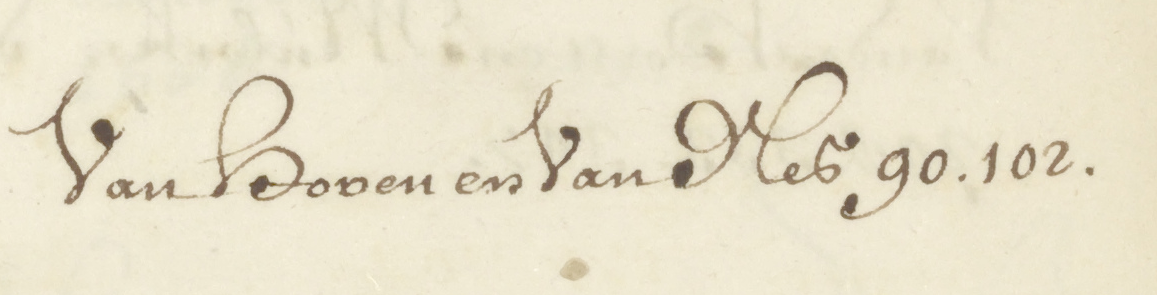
van Hoven en Van Mes, 90. 102.
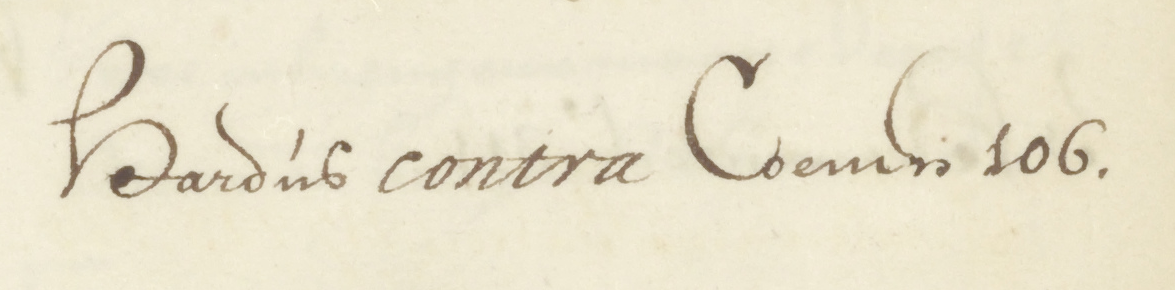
Hardus contra Coenen 106.
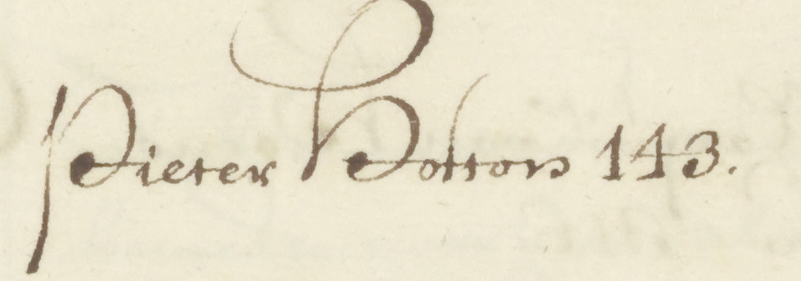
Pieter Hotton 143.
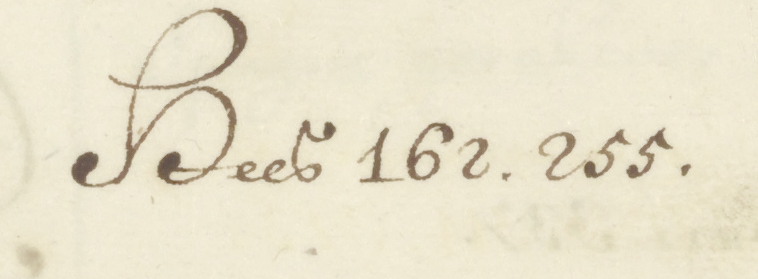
Hees 162, 255.
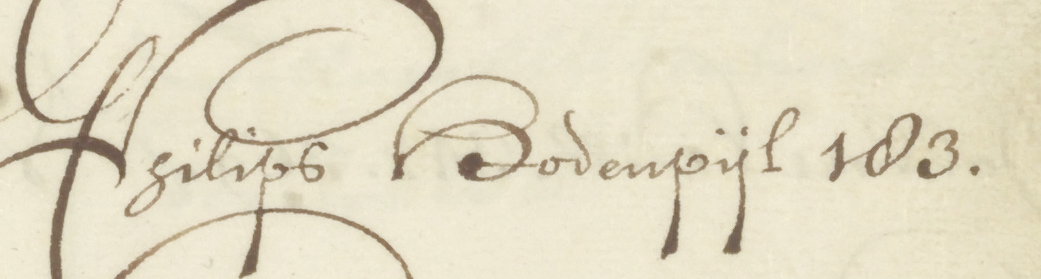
Philips Hodenpijl 183.
